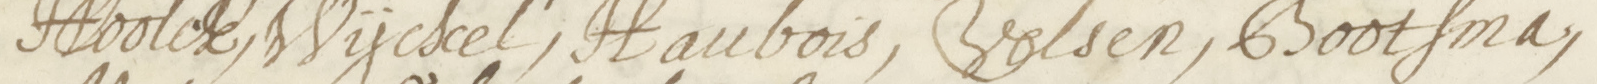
Hoolck, Wijckel, Haubois, Velsen, Bootsma,
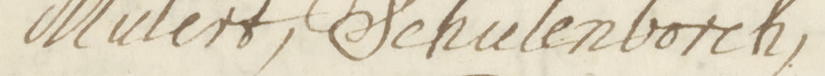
Mulert, Schulenborch,
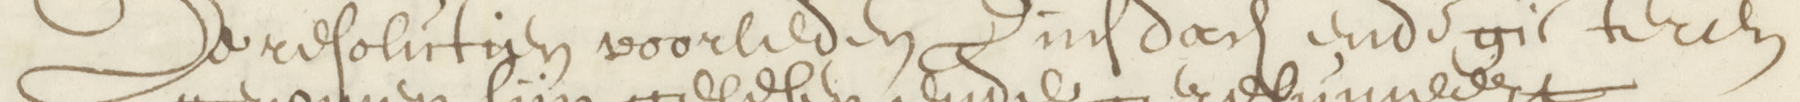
De resolutien voorleden Dinsdach ende gisteren
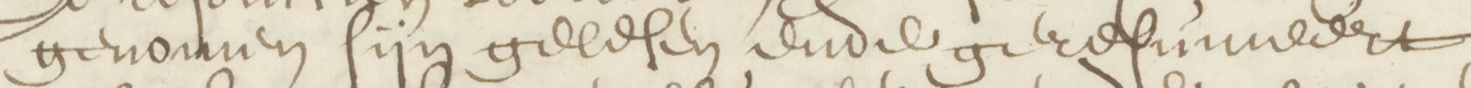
genomen sijn gelesen ende geresumeert
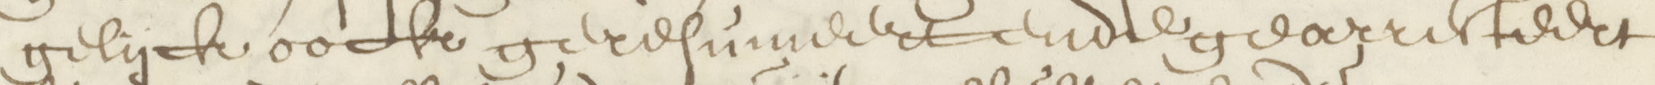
gelijck oock geresumeert ende gearresteert
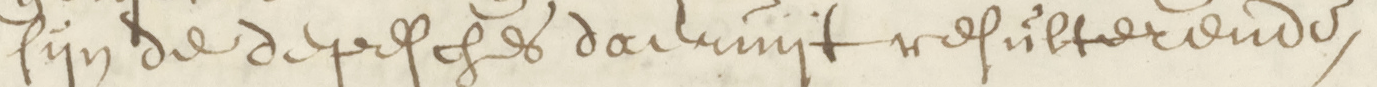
sijn de depesches daeruijt resulterende.
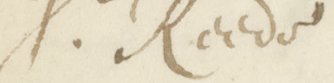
Jr. Reede
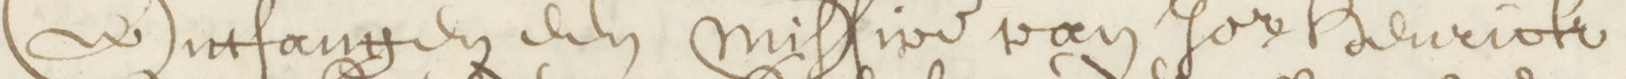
Ontfangen een missive van Jor. Henrick
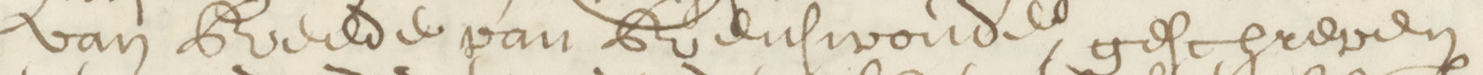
van Reede van Renswoude, geschreven
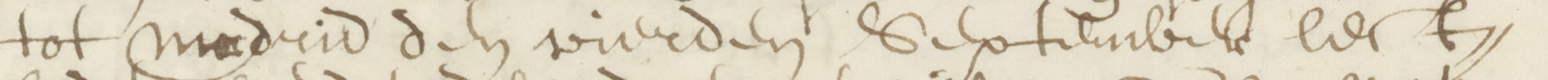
tot Madrid den vierden September lest,,
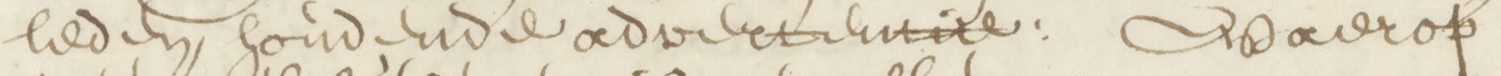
leden, houdende advertentie: Waerop
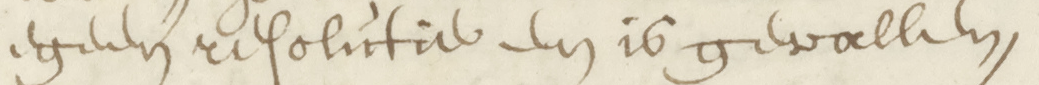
egeen resolutie en is gevallen.
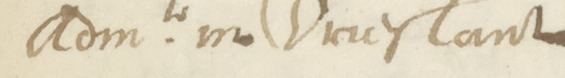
Admt. in Vrieslant
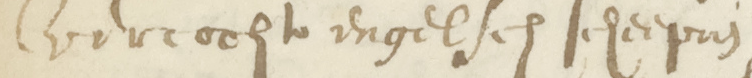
vercocht engelsch scheepien
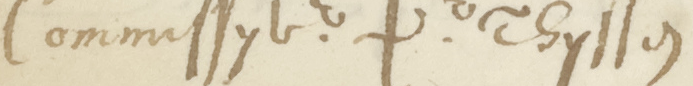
Commissyvr. Pr. Thyssen
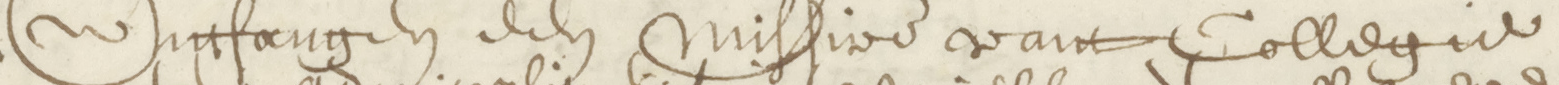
Ontfangen een missive vant Collegie
